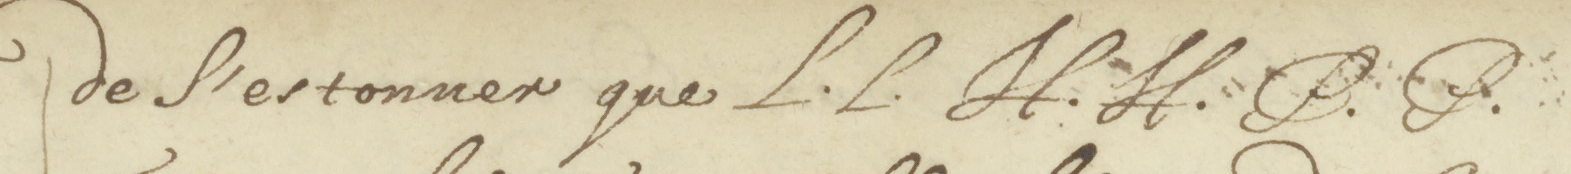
De s‛estonner que L.L. H.H. P.P.
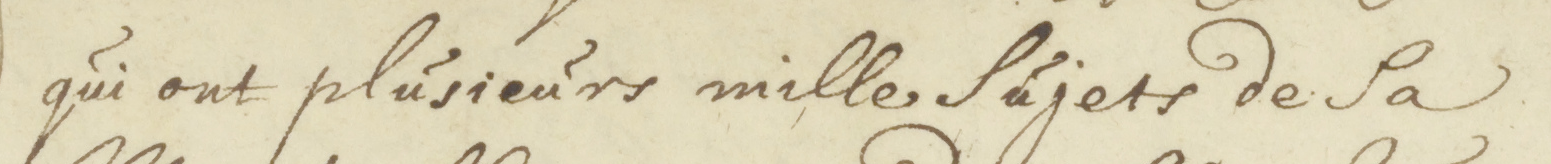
qui ont plusieurs mille sujets de sa
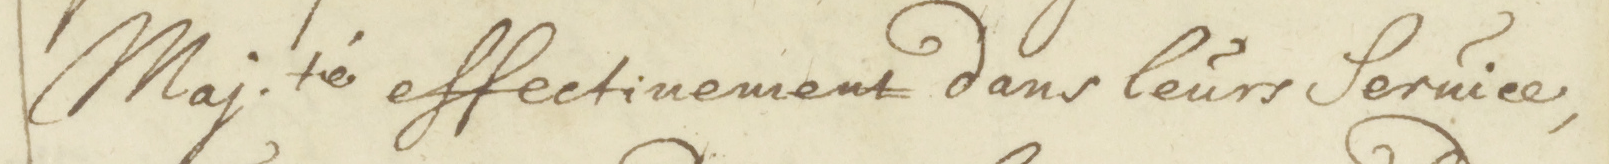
Majte. effectivement dans leurs seruice,
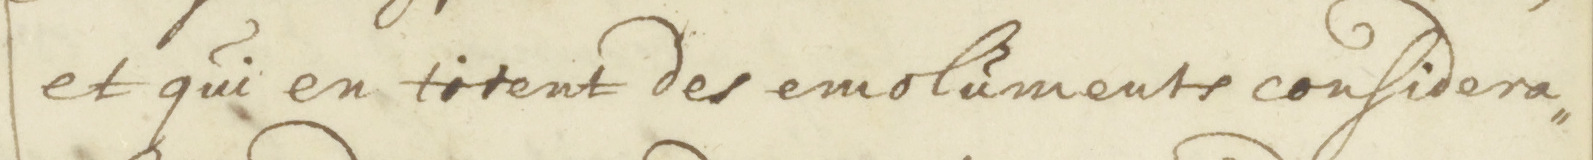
et qui en tirent des emoluments considera„
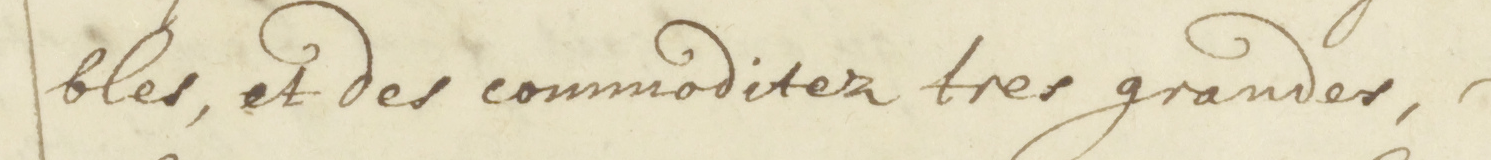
bles, et des commoditez tres grandes,
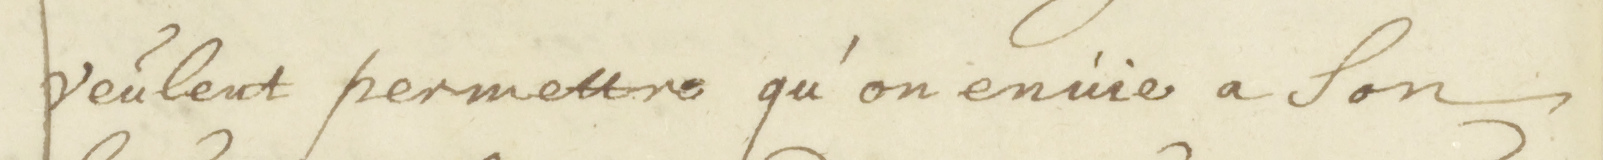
veulent permettre qu‛on enuie a son
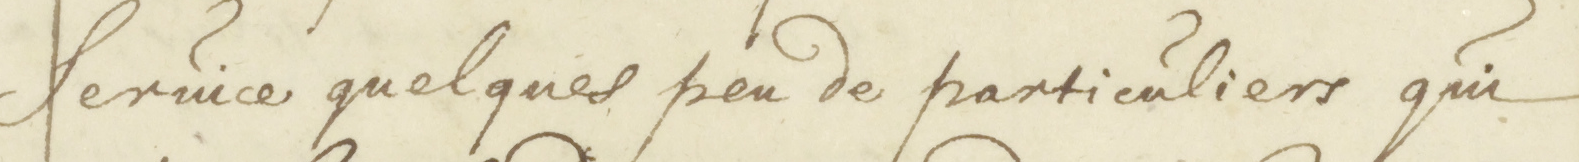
seruice quelques peu de particuliers qui
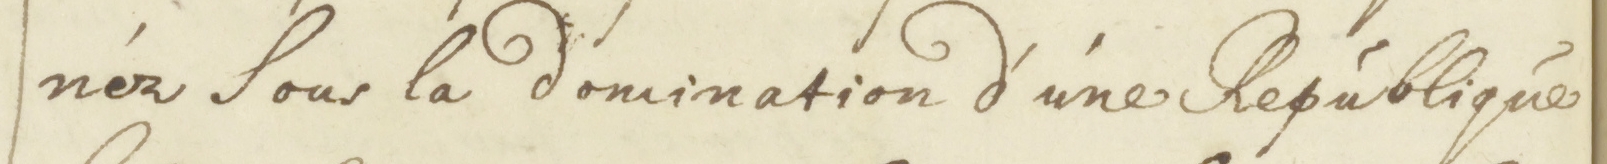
néz sous la domination d‛une Republique
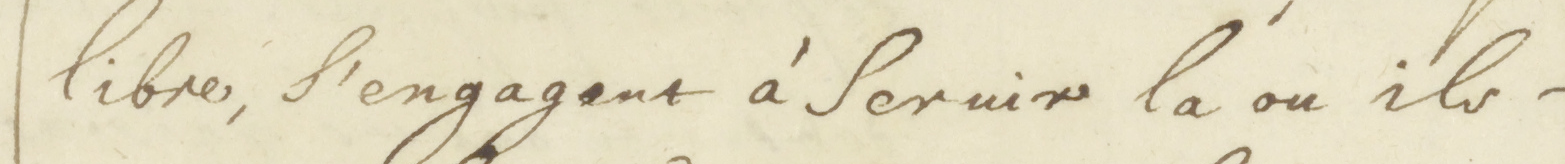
libre, s‛engagent a seruir la ou ils
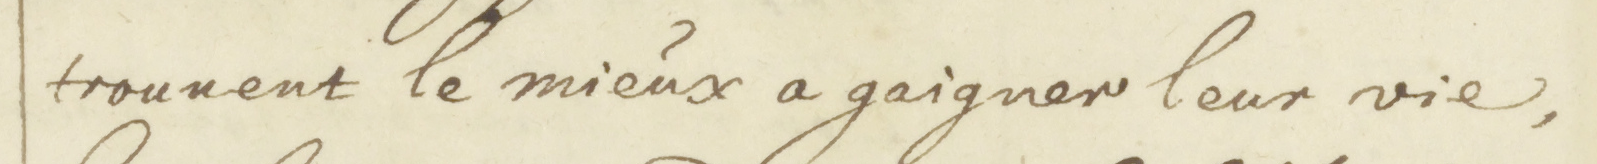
trouvent le mieux a gaigner leur vie,
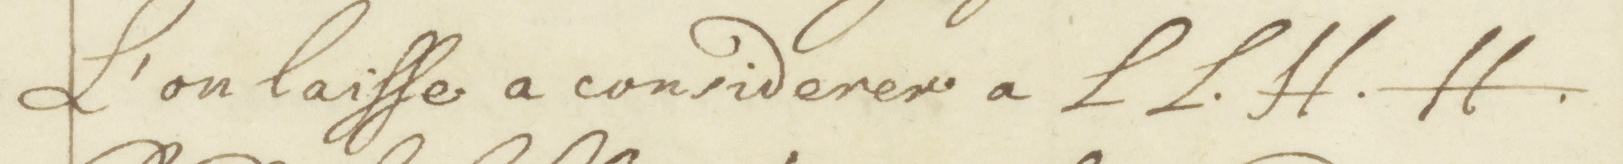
L‛on laisse a considerer a L.L.H.H.
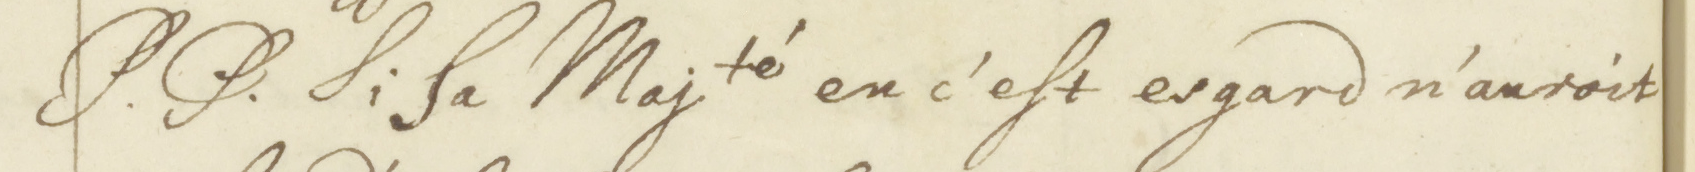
P.P. si sa Majté en c‛est esgard n'auroit
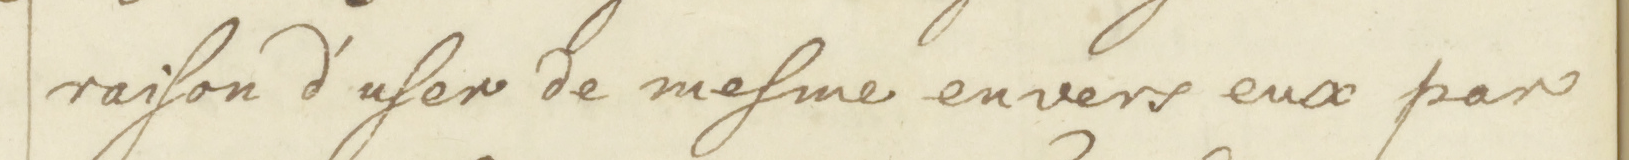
raison d'user de mesme envers eux par
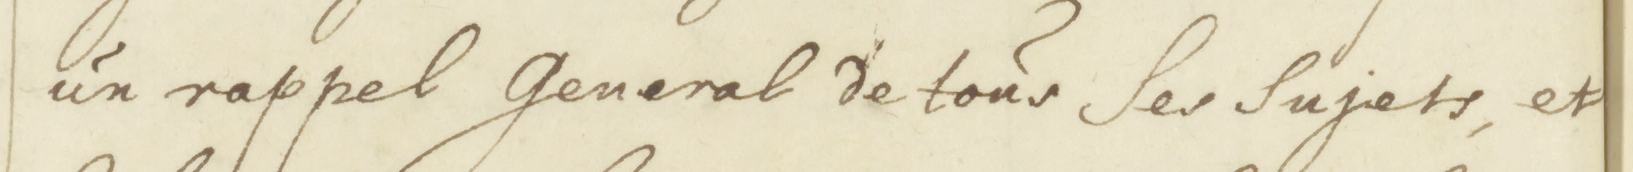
un rappel General de tous ses sujets, et
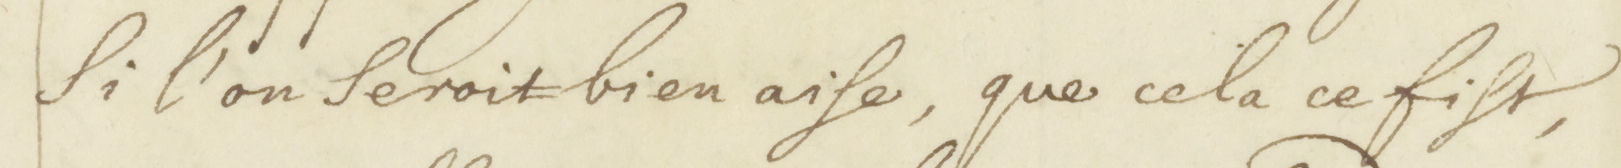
si l‛on seroit bien aise, que cela ce fist,
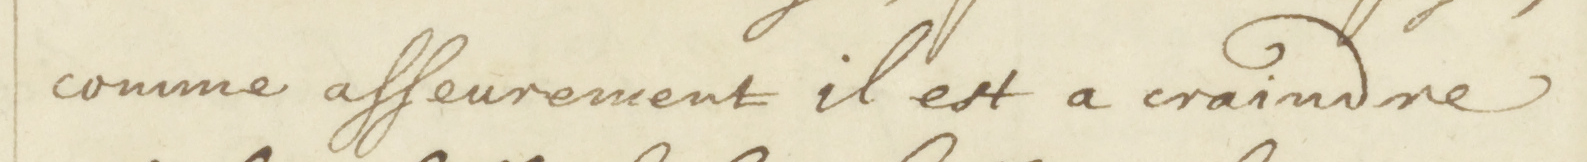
comme asseurement il est a craindre
